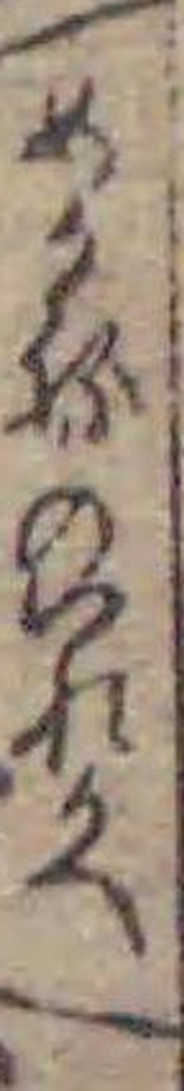めかねのいれかへ
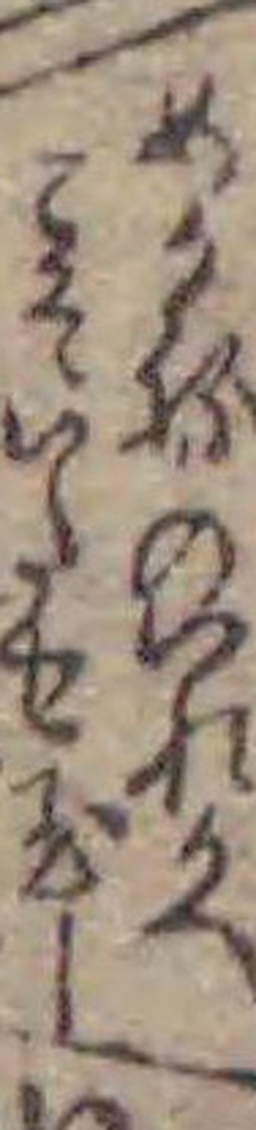こそいたせ玉しい
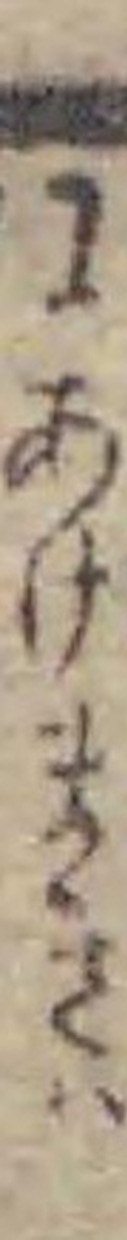にあけまきは
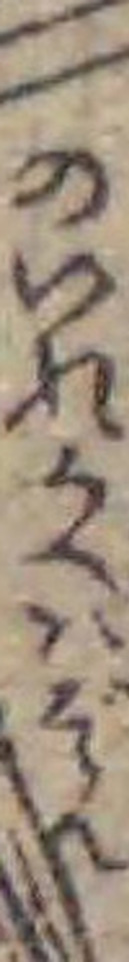のいれかへはぞん
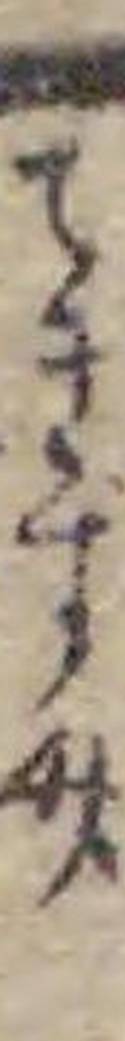てきず介
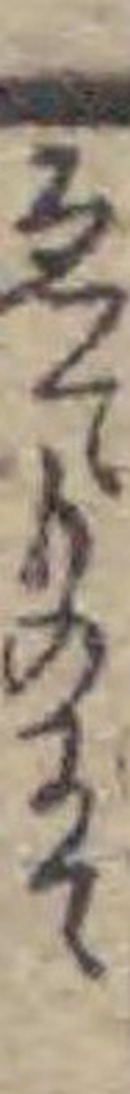ゑてものにて
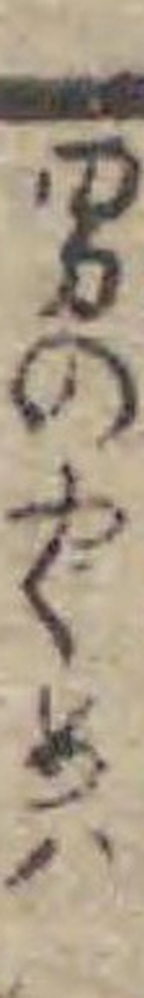男のやくめは
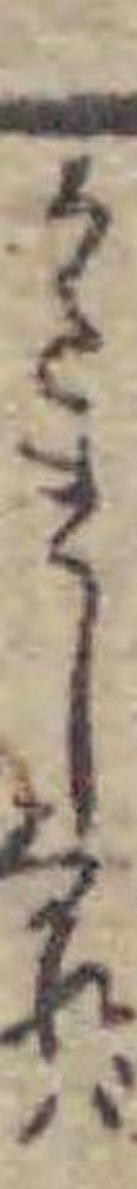かたきしなれば
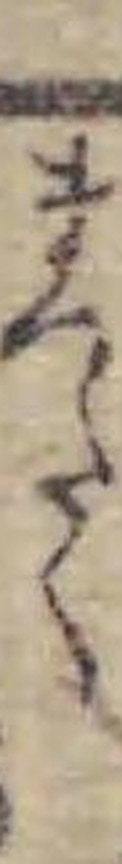まつたく
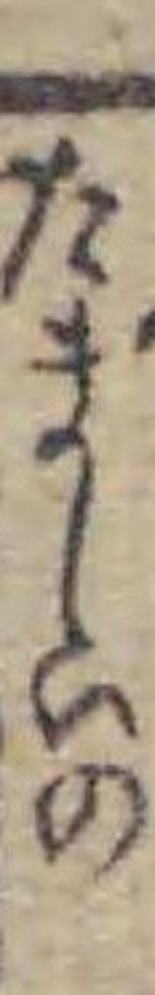たましいの
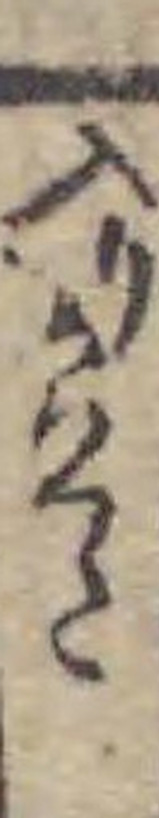入りかはつた
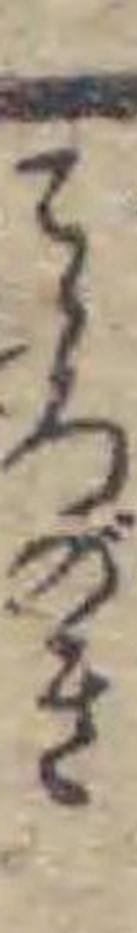こゝろづき
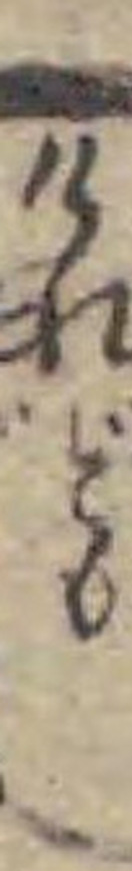けれども
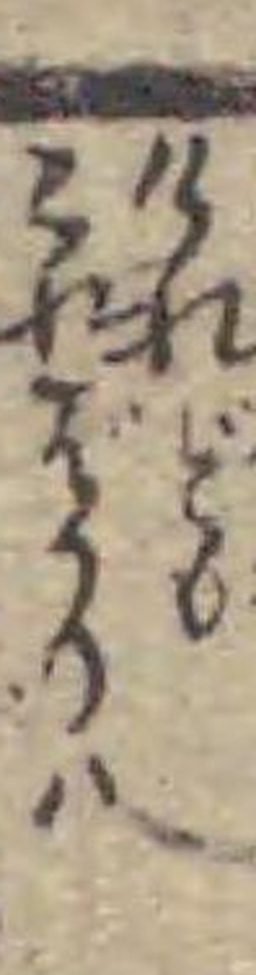こればかりは
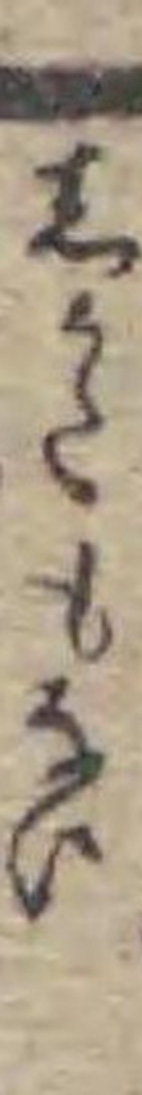しかたもない
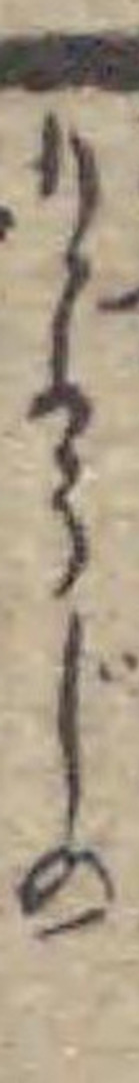りようじの
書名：江戸花俳優贔屓 : 3巻
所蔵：国立国会図書館 National Diet Library, JAPAN
